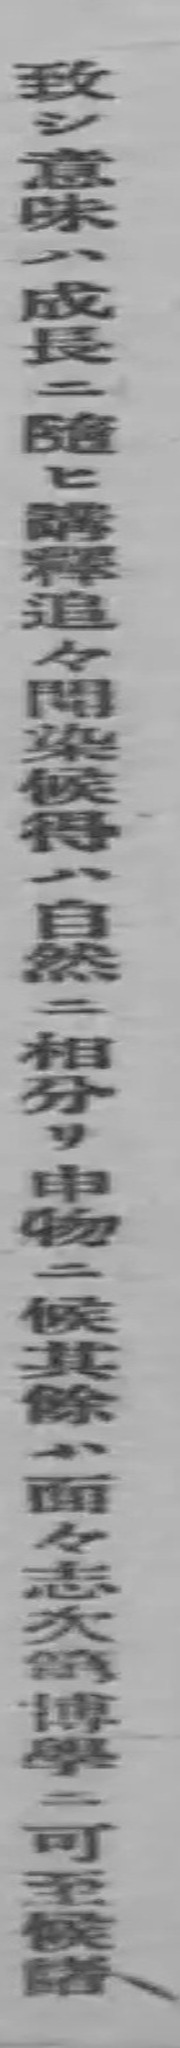致シ意味ハ成長ニ随ヒ講釈追々聞染候得ハ自然ニ相分リ申物ニ候其余ハ面々志次第博学ニ可至候諸
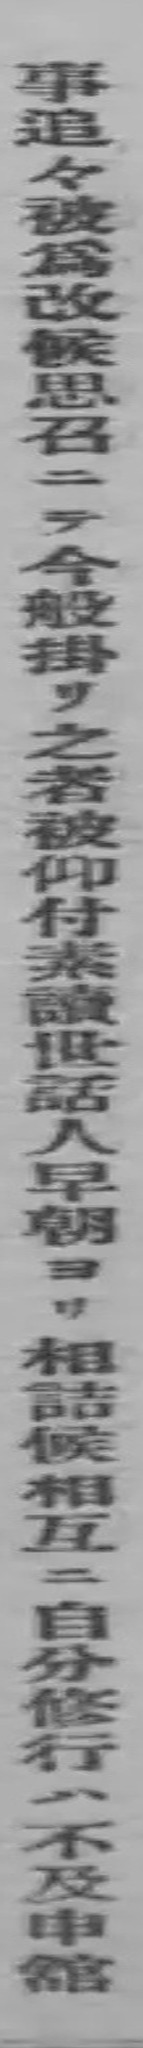事追々被為改候思召ニテ今般掛リ之者被仰付素読世話人早朝ヨリ相詰候相互ニ自分修行ハ不及申館
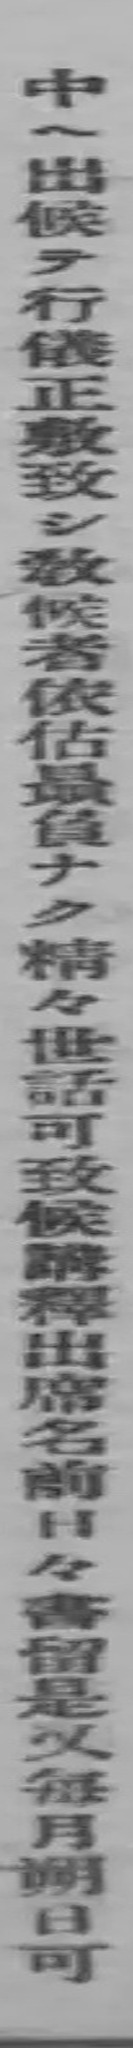中ヘ出候テ行儀正敷致シ教候者依怙贔屓ナク精々世話可致候講釈出席名前日々書留是又毎月朔日可
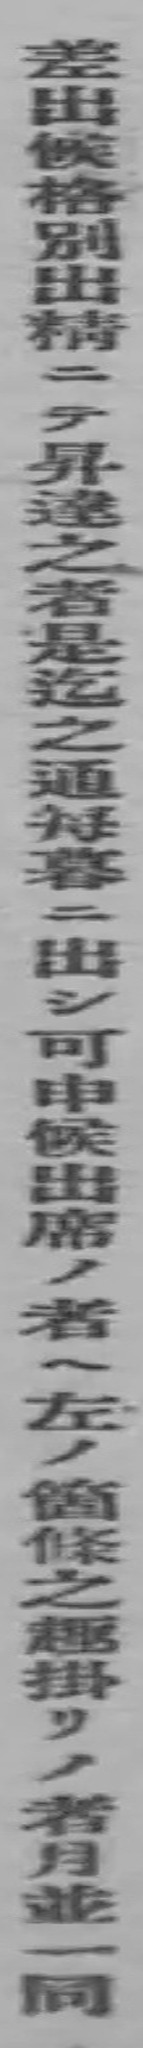差出候格別出精ニテ昇達之者是迄之通毎暮ニ出シ可申候出席ノ者ヘ左ノ箇條之趣掛リノ者月並一同
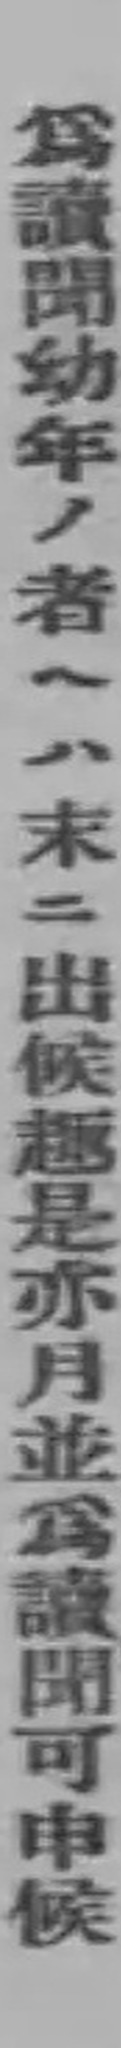為読聞幼年ノ者ヘハ末ニ出候趣是亦月並為読聞可申候
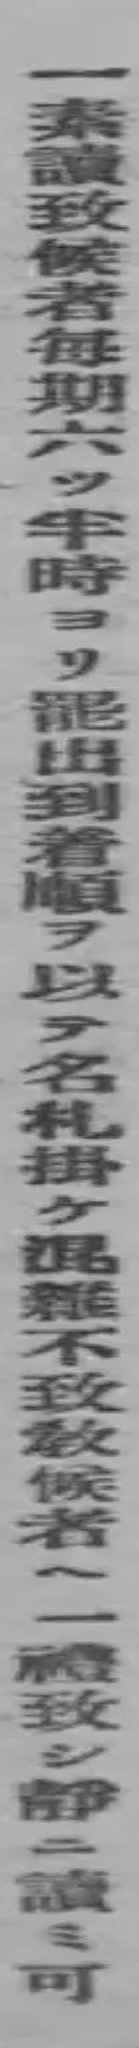一素読致候者毎期六ツ半時ヨリ罷出到着順ヲ以テ名札掛ケ混雑不致教候者ヘ一礼致シ静ニ読ミ可
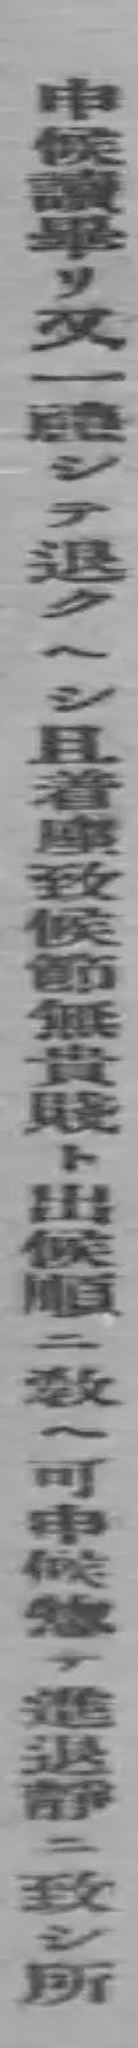申候読畢リ又一礼シテ退クヘシ且着座致候節無貴賤ト出候順ニ教ヘ可申候惣テ進退静ニ致シ所

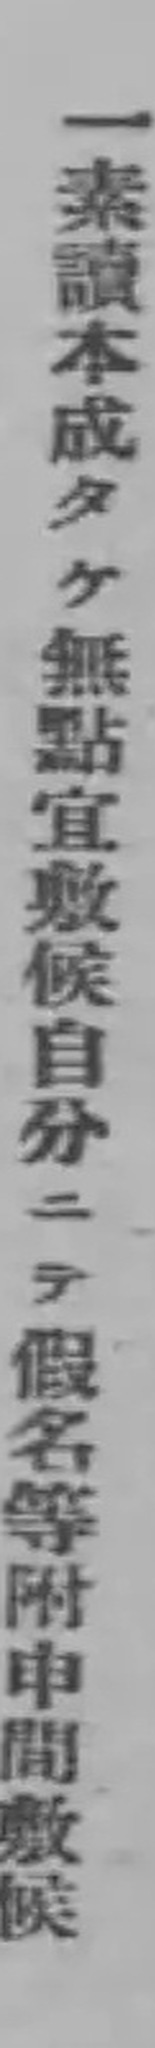一素読本成タケ無点宜敷候自分ニテ仮名等附申間敷候
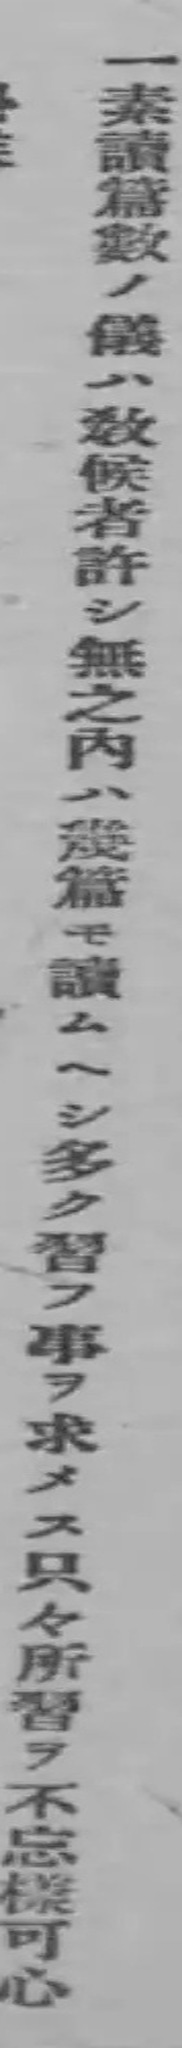一素読篇数ノ儀ハ教候者許シ無之内ハ幾篇モ読ムヘシ多ク習フ事ヲ求メス只々所習ヲ不忘様可心
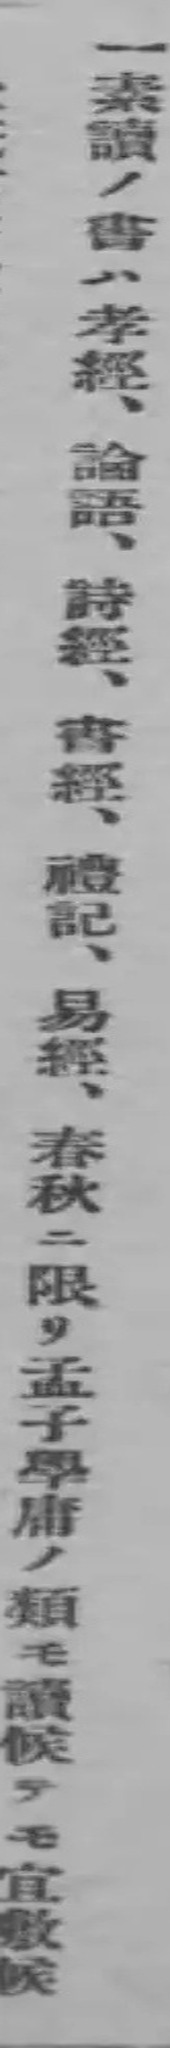一素読ノ書ハ孝経、論語、詩経、書経、礼記、易経、春秋ニ限リ孟子学庸ノ類モ読候テモ宜敷候
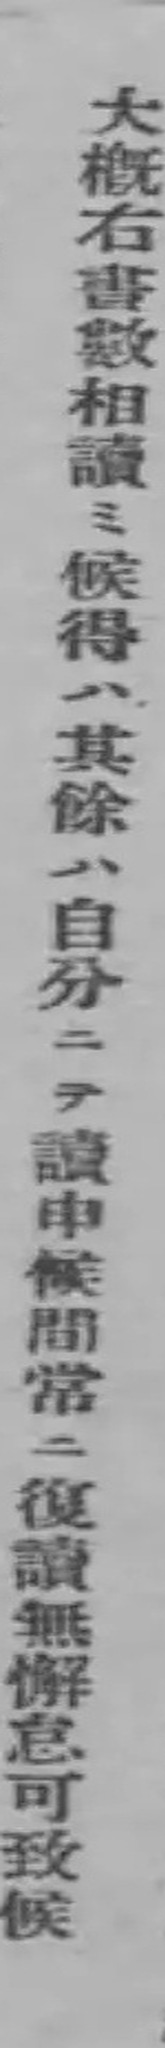大概右書数相読ミ候得ハ其余ハ自分ニテ読申候間常ニ復読無懈怠可致候
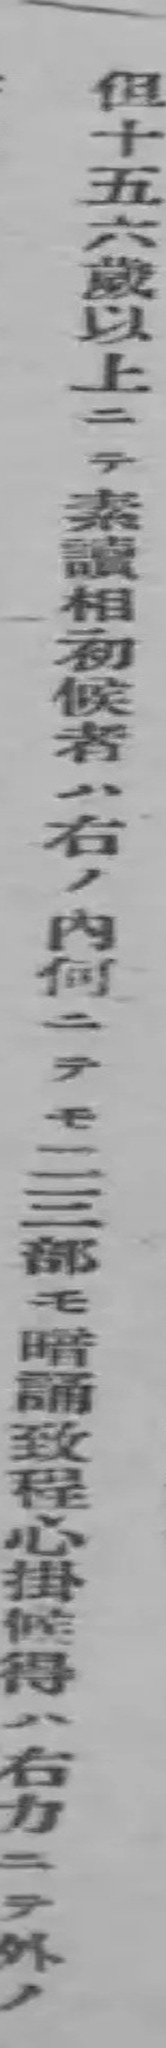但十五六歳以上ニテ素読相初候者ハ右ノ内何ニテモ二三部モ暗踊致程心掛候得ハ右力ニテ外ノ
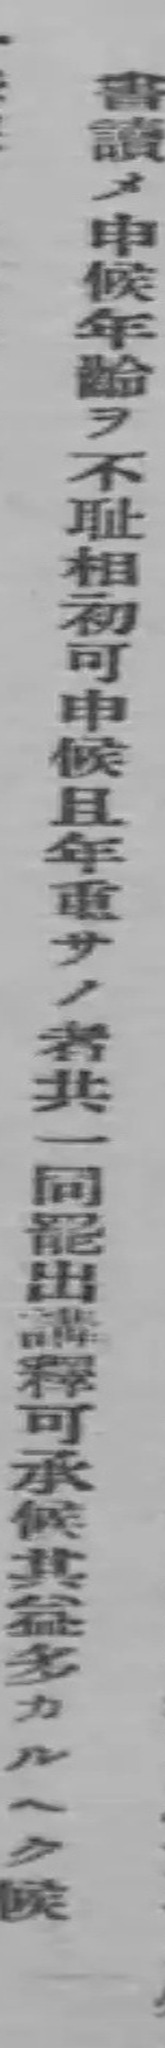書読メ申候年齢ヲ不耻相初可申候且年重サノ者共一同罷出講釈可承候其益多カルヘク候
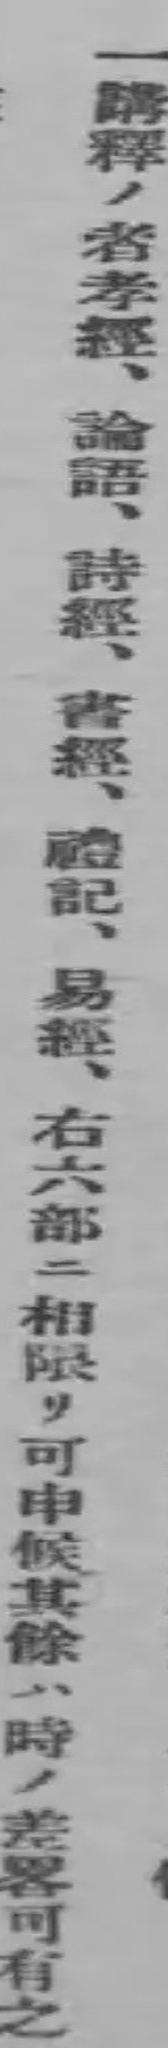一講釈ノ者孝経、論語、詩経、書経、礼記、易経、右六部ニ相限リ可申候其余ハ時ノ差略可有之
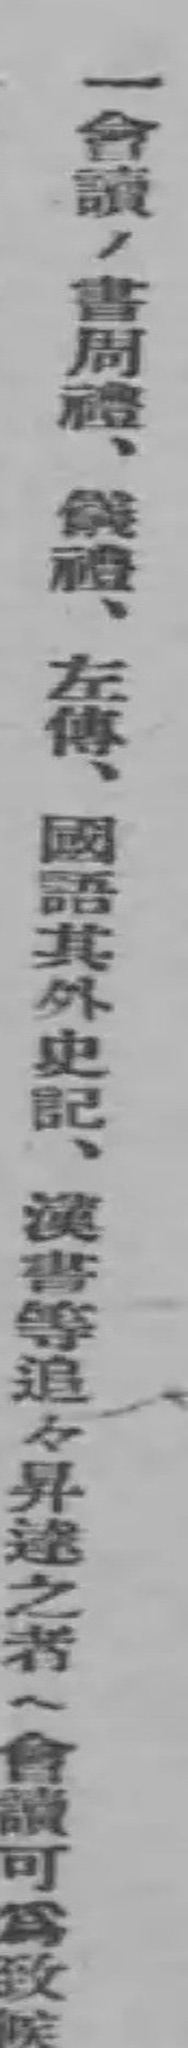一会読ノ書周礼、儀礼、左伝、国語其外史記、漢書等追々昇達之者ヘ会読可為致候
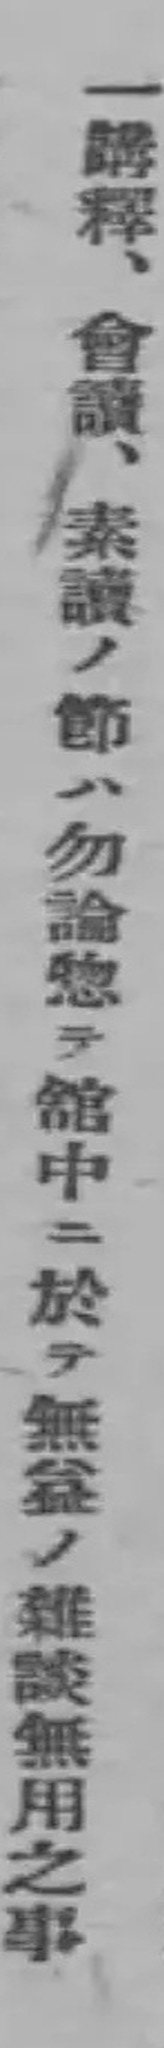一講釈、会読、素読ノ節ハ勿論惣テ館中ニ於テ無益ノ雑談無用之事
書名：豊橋市史談
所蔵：国立国会図書館 National Diet Library, JAPAN
